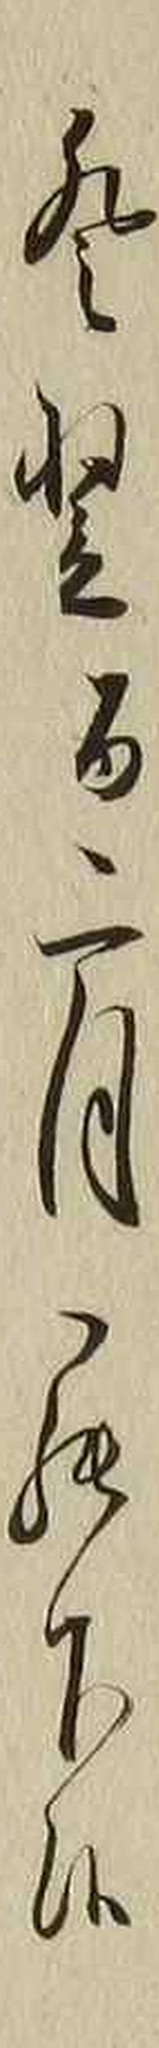登翌酉二月罷下候
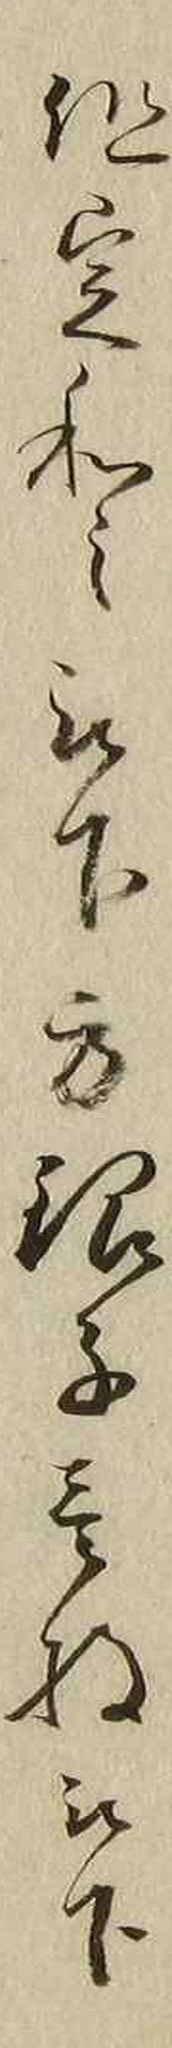但定和之被下方銀子壱枚被下
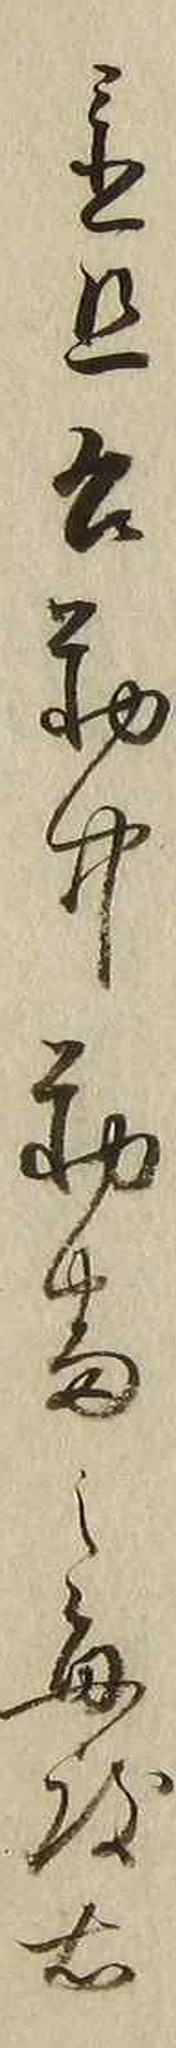置且右勤中勤番之毎度右
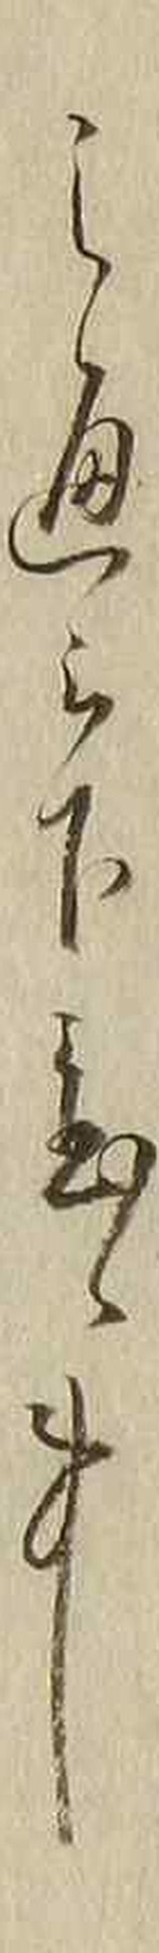之通被下置候事
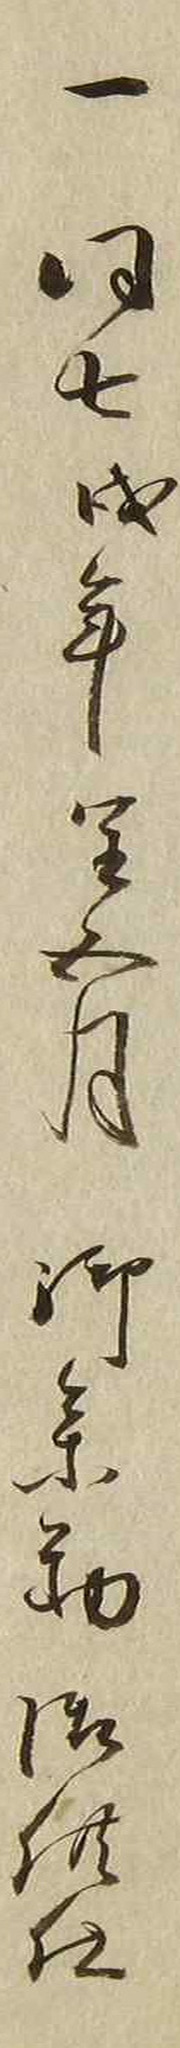一同七戌年閏五月御参勤御供仕
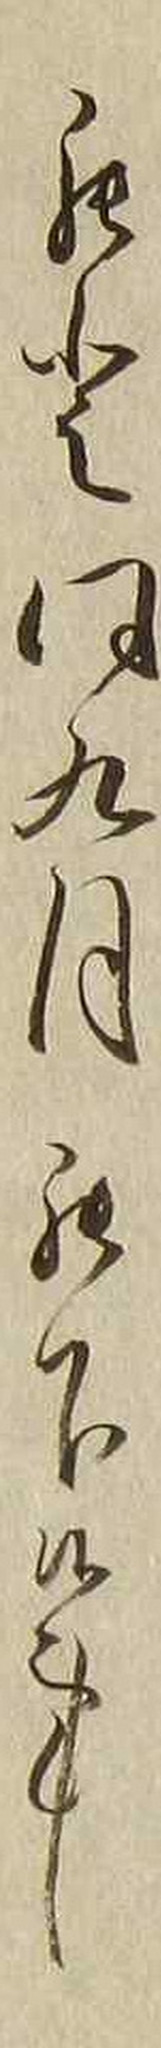罷登同九月罷下候事
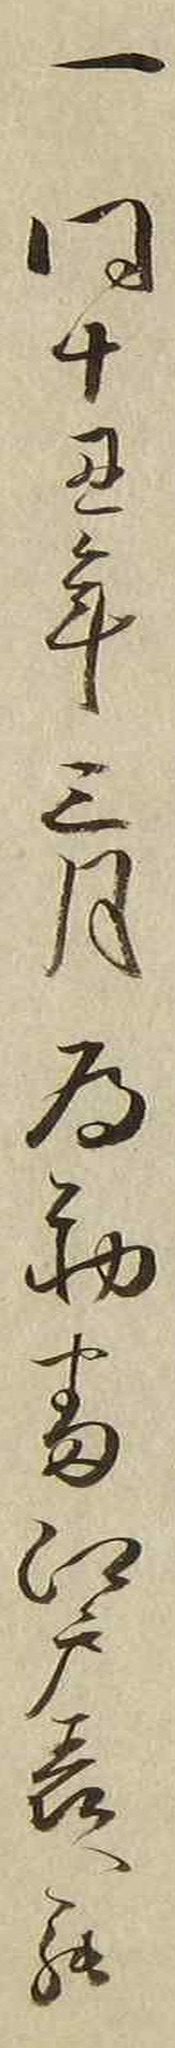一同十丑年三月為勤番江戸表へ罷

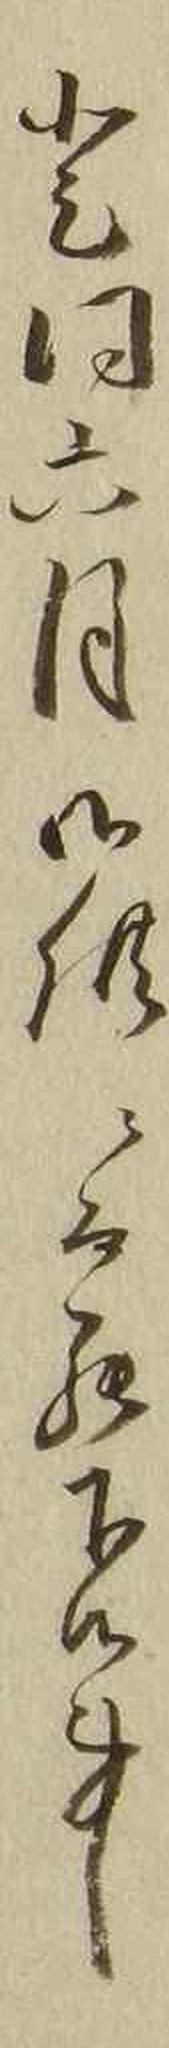登同六月御供ニ而罷下候事
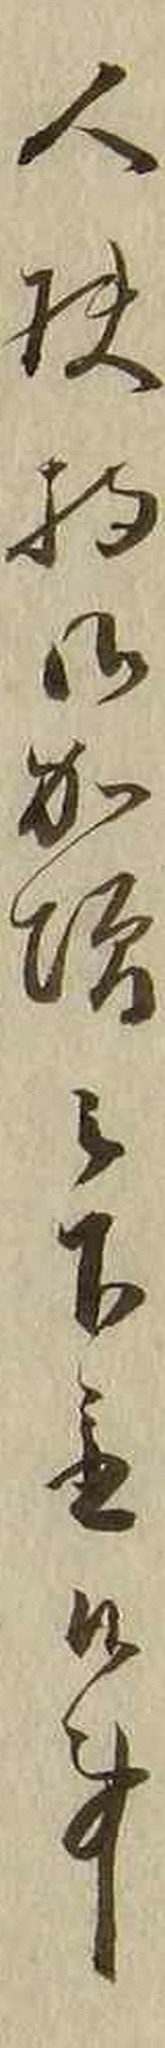人扶持御加増被下置候事
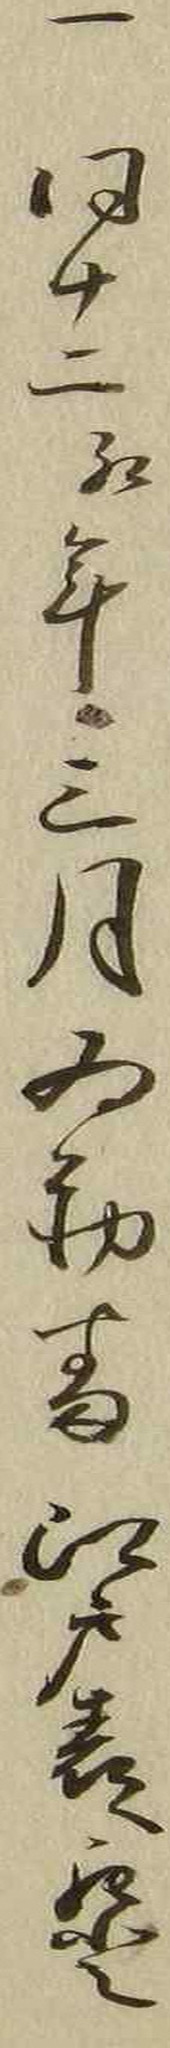一同十二卯年三月為勤番江戸表へ罷登
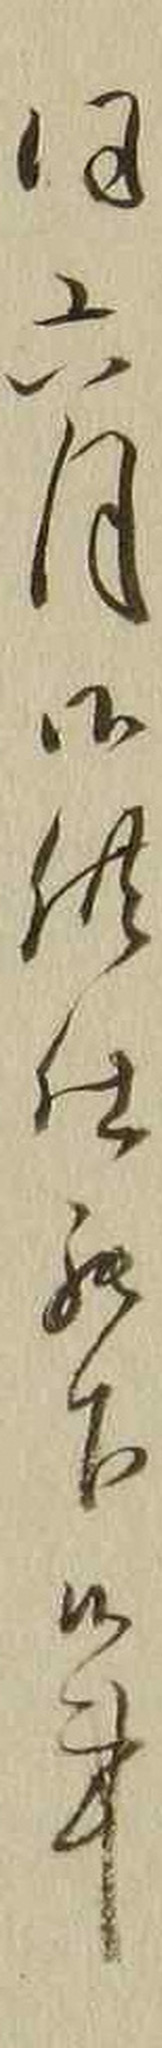同六月御供仕罷下候事
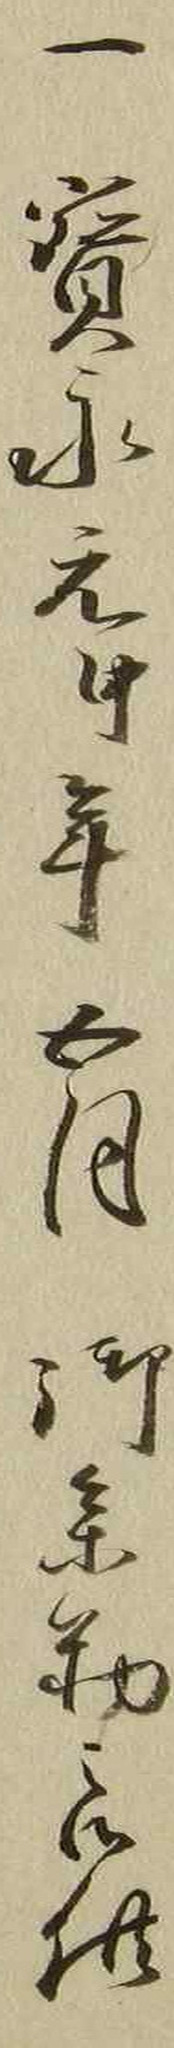一宝永元申年五月御参勤之御供
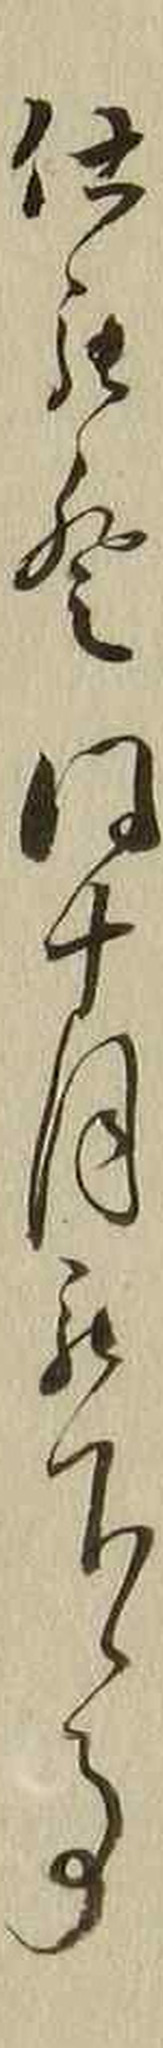仕罷登同十月罷下候事
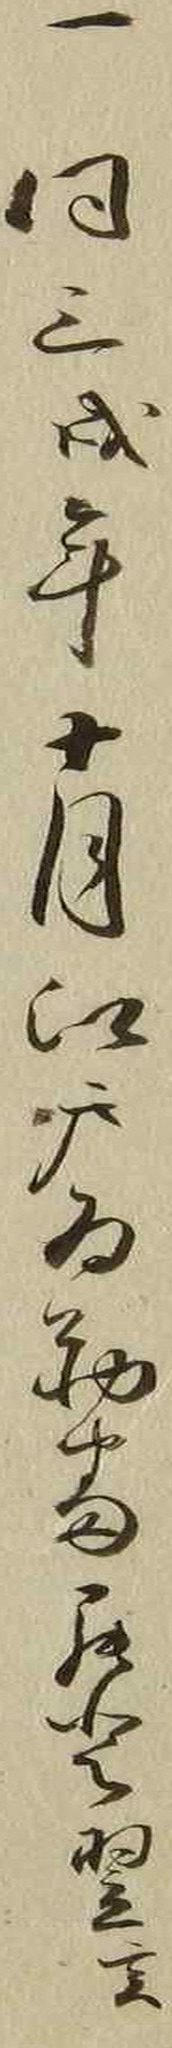一同三戌年十月江戸為勤番罷登翌亥
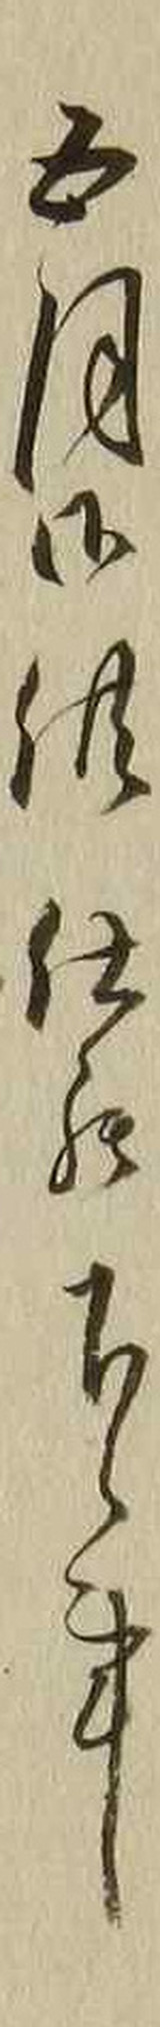五月御供仕罷下候事
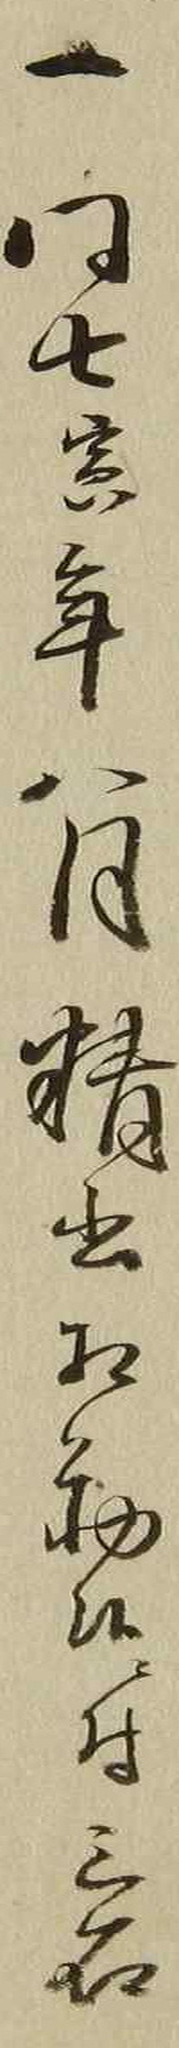一同七寅年八月精出相勤候ニ付三石
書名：諸士系譜　巻之28　い之部28
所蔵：会津若松市立会津図書館
